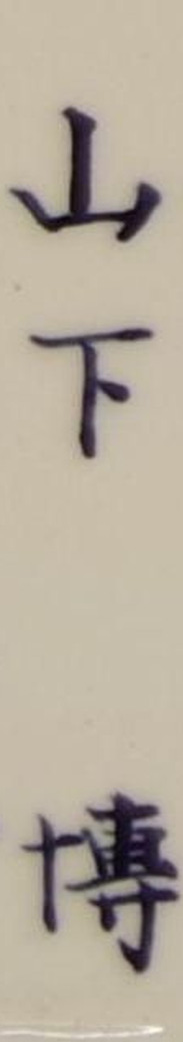山下博

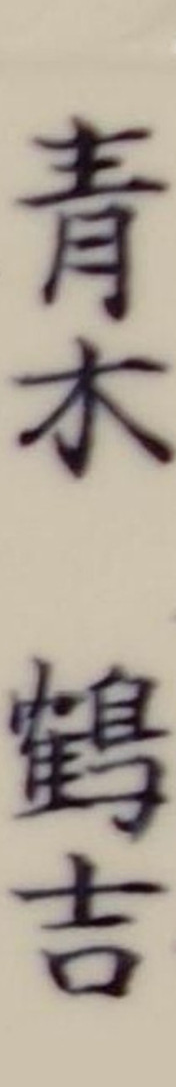青木鶴吉
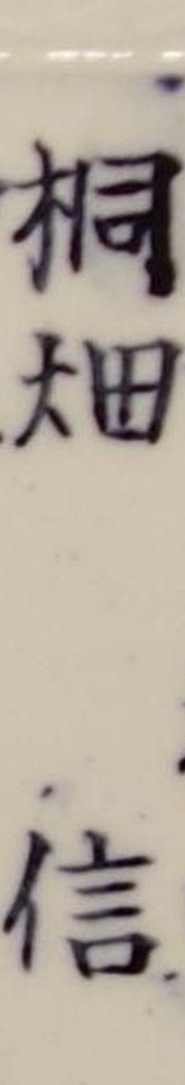桐畑信
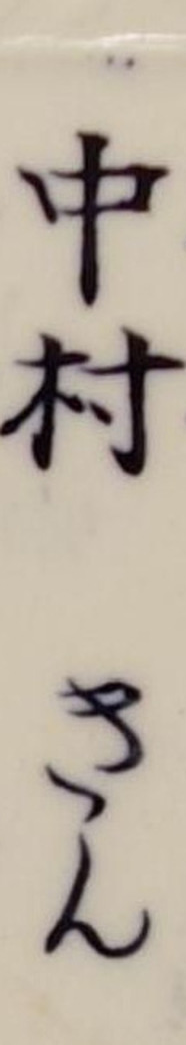中村きん
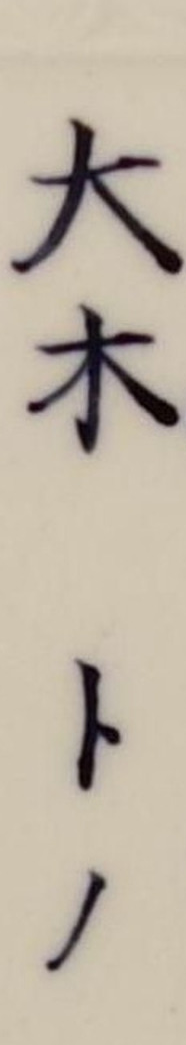大木トノ
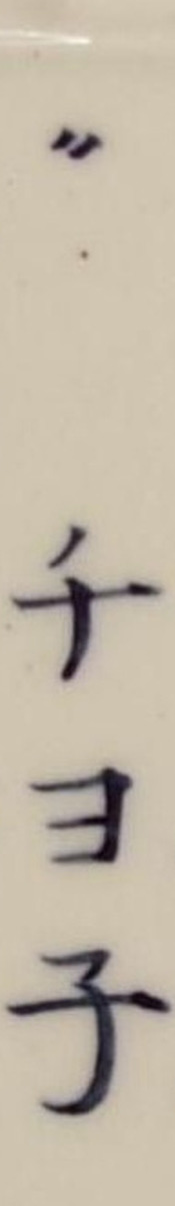チヨ子
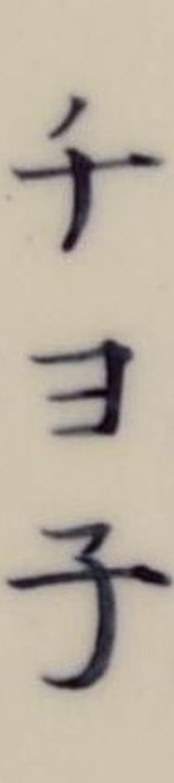チヨ子
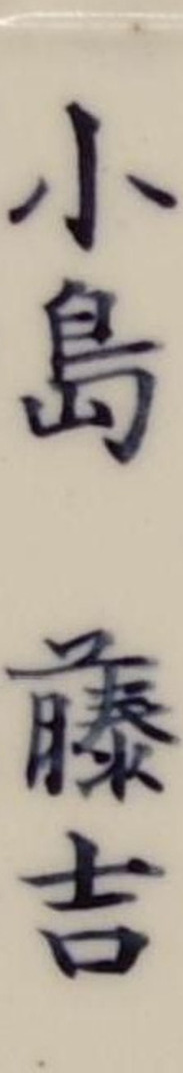小島藤吉
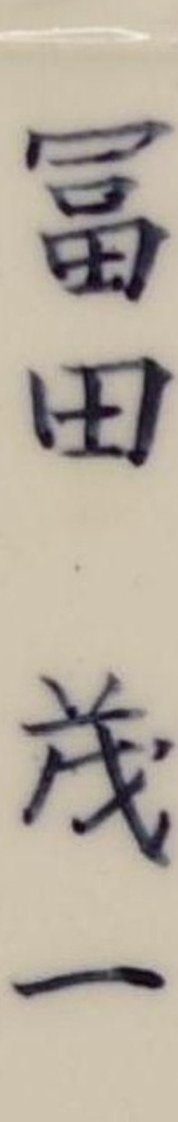冨田茂一
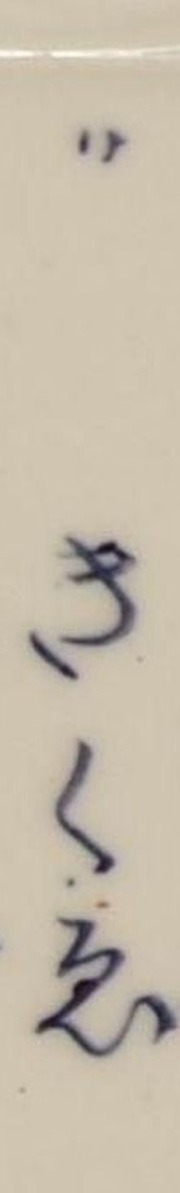きくゑ
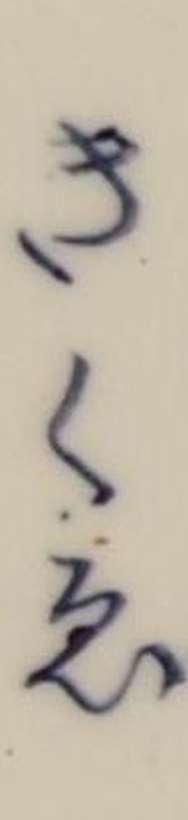きくゑ

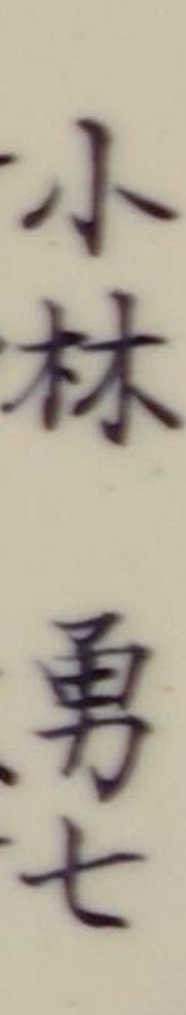小林勇七
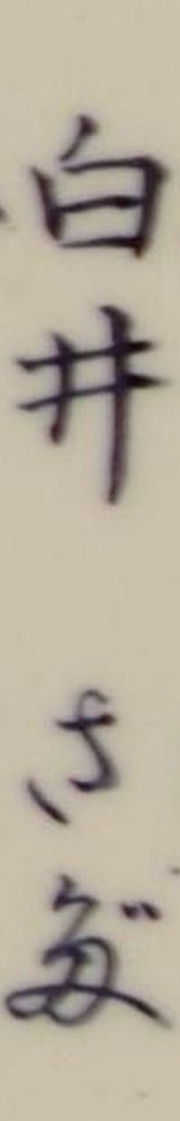白井さだ
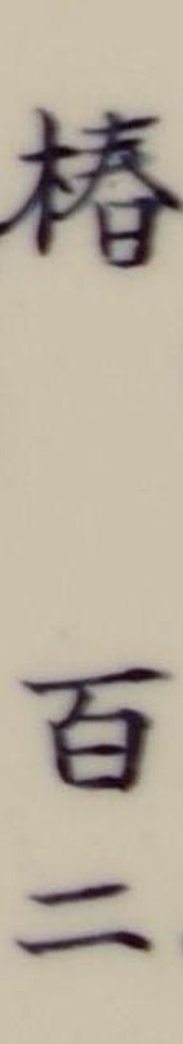椿百二
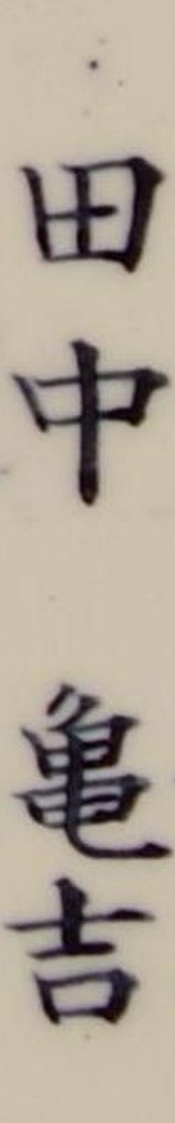田中亀吉
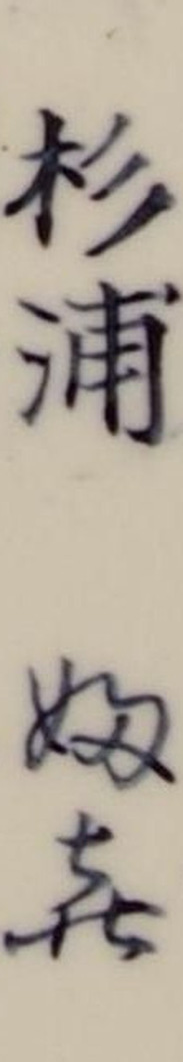杉浦ふき
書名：M~S
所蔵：高野山金剛峯寺
